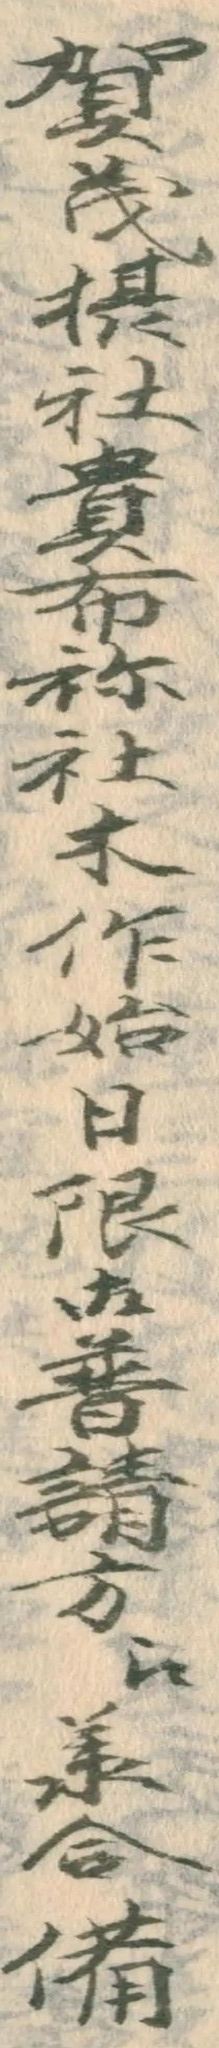賀茂摂社貴布祢社木作始日限御普請方江承合備
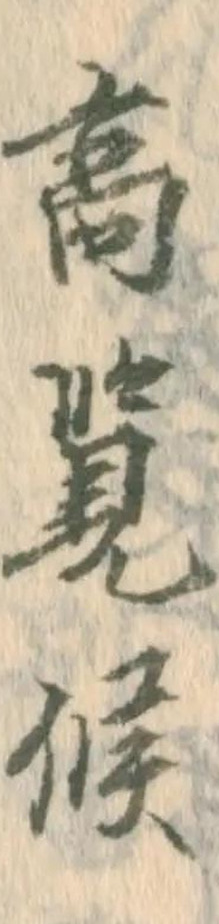高覧候
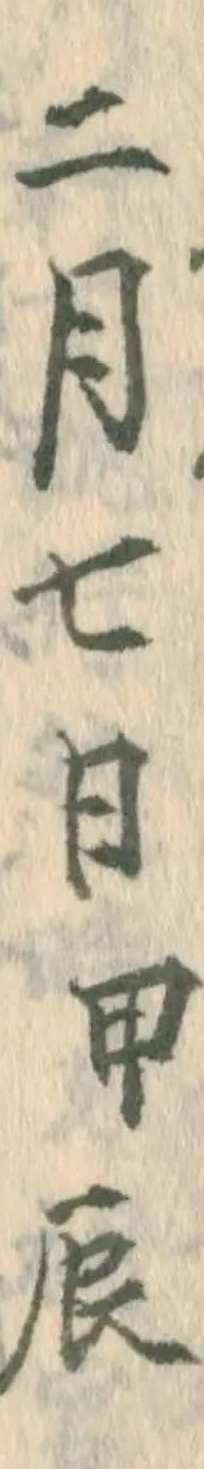二月七日甲辰
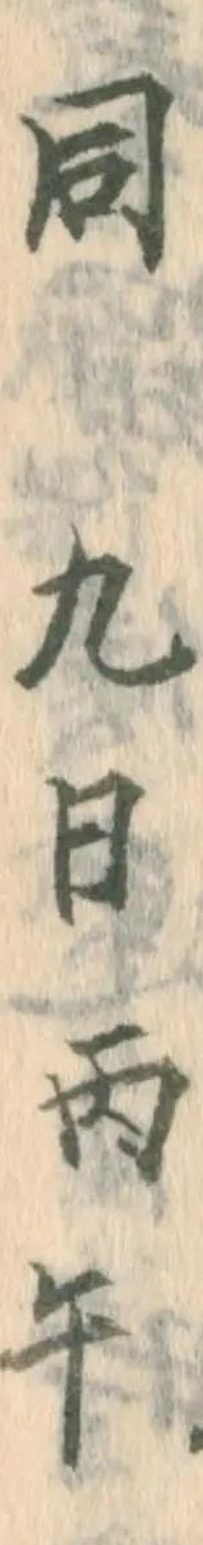同九日丙午

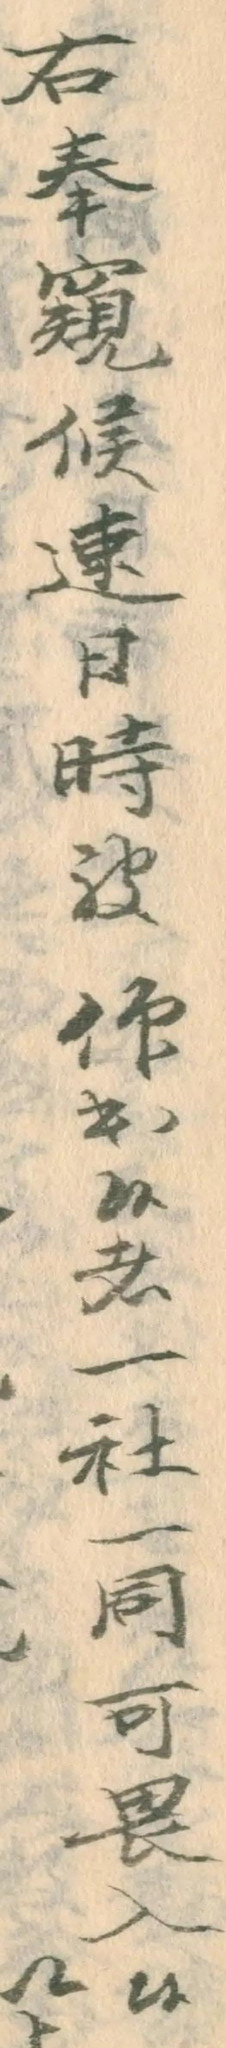右奉窺候速日時被仰出候は一社一同可畏入候
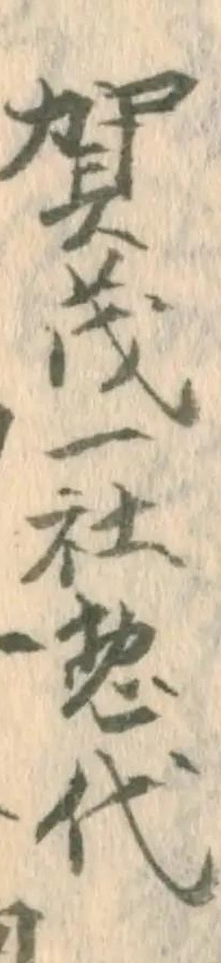賀茂一社惣代
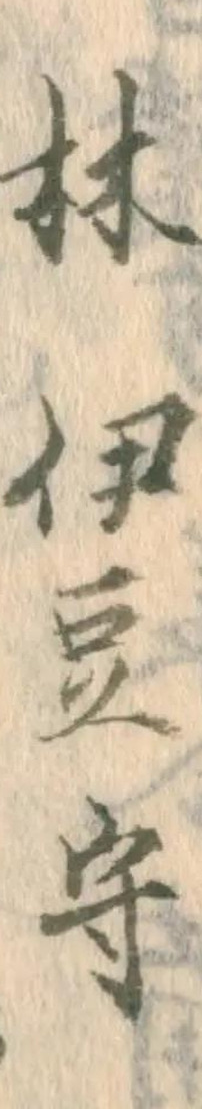林伊豆守
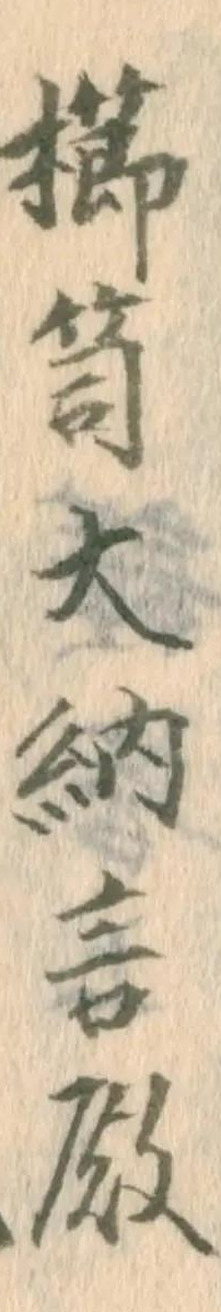櫛笥大納言殿
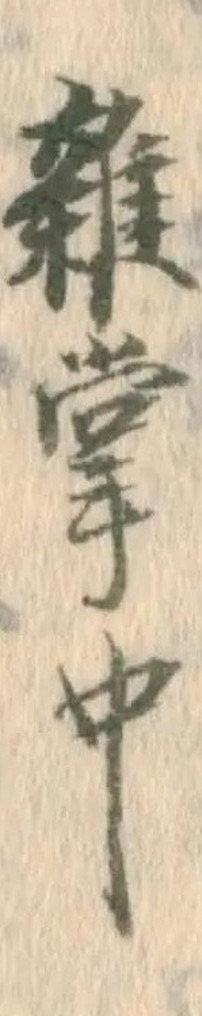雑掌中
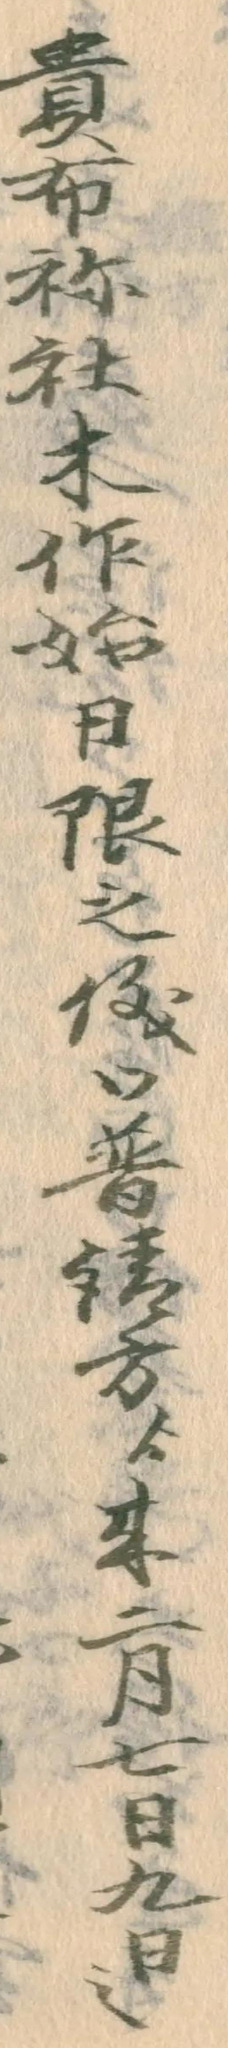貴布祢社木作始日限之儀御普請方ゟ来二月七日九日之
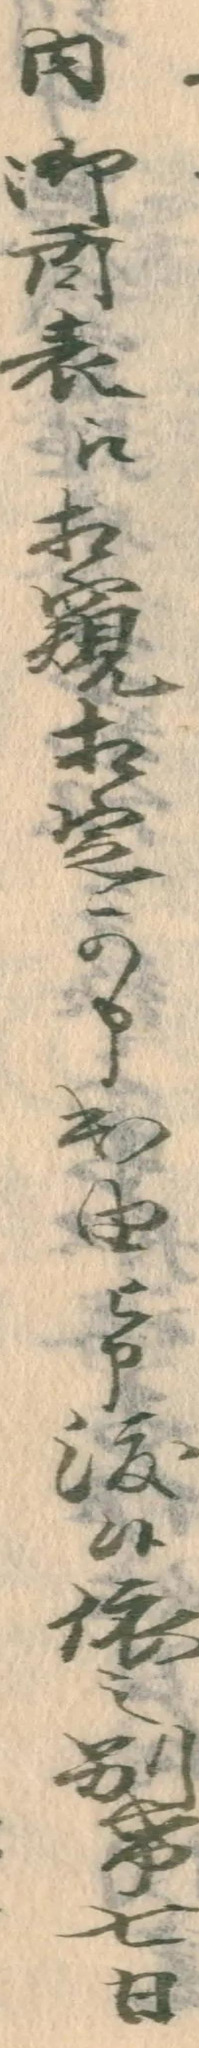内御所表江相窺相定可申出由被申渡候依之別帋七日
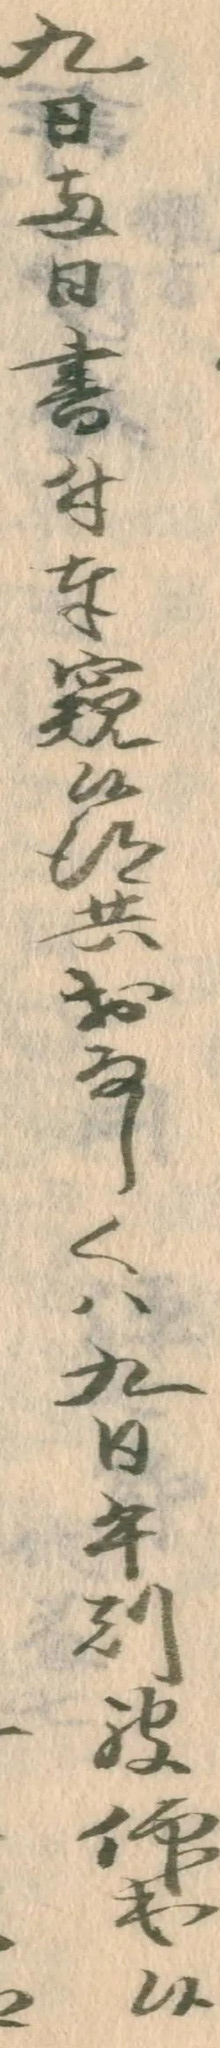九日両日書付奉窺候得共おなしくハ九日午刻被仰出候
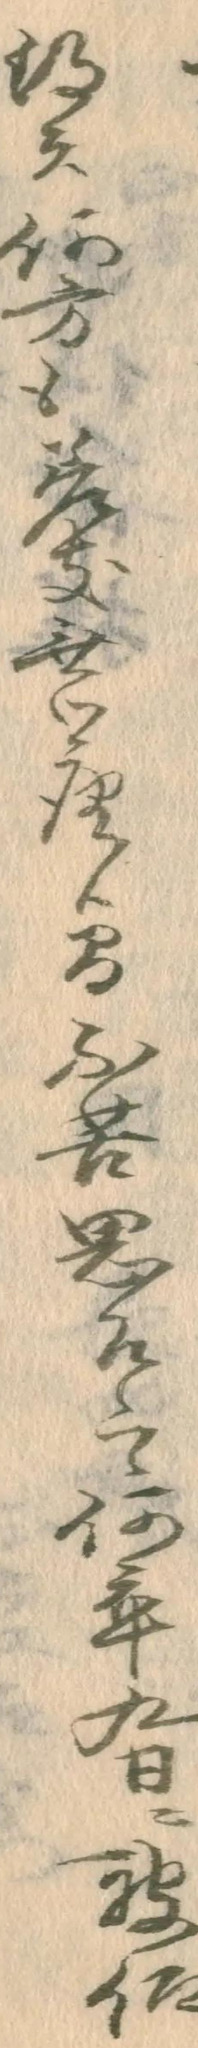得は何方も差支無御座候間不苦思召候ハヽ何卒九日ニ被仰
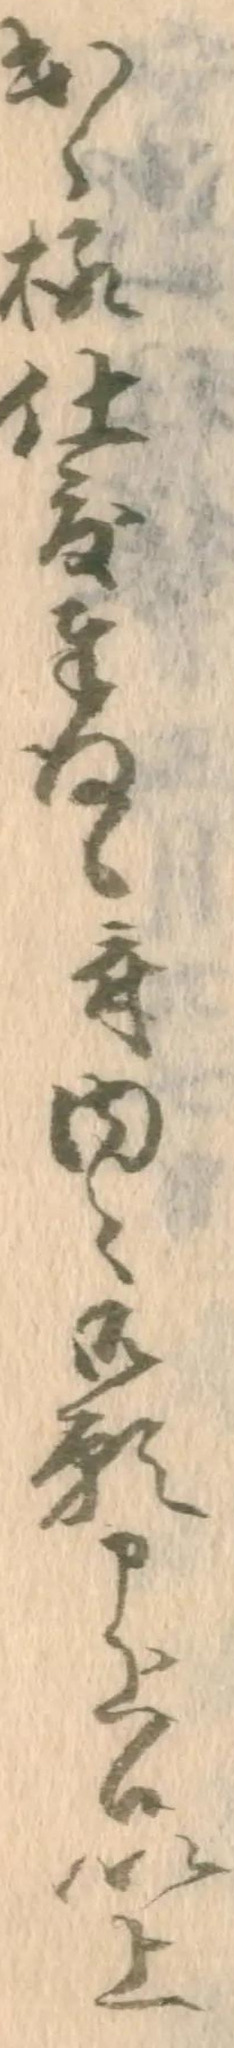出候様仕度奉存候ニ付内々御願申上候以上
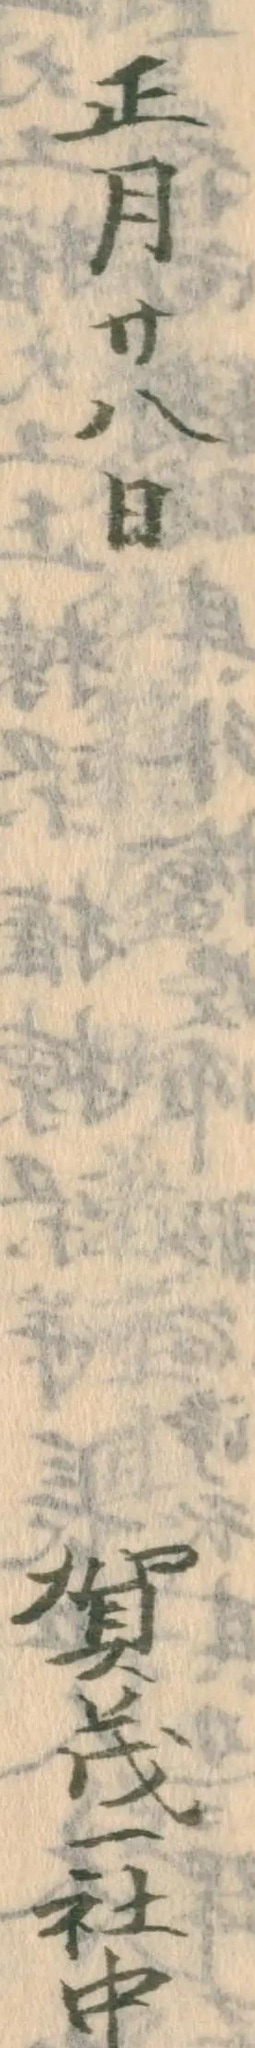正月廿八日賀茂一社中
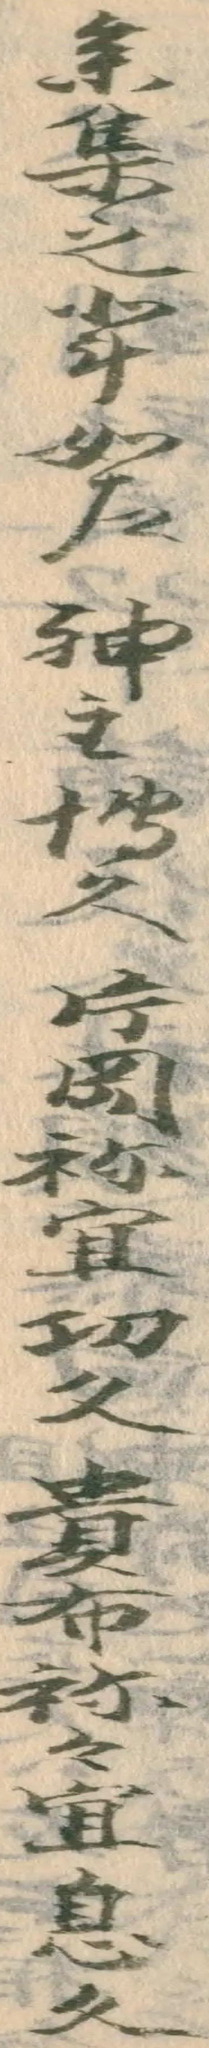参集之輩如左神主博久片岡祢宜功久貴布祢々宜息久
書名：賀茂社記録. 第17冊
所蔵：国立国会図書館 National Diet Library, JAPAN
